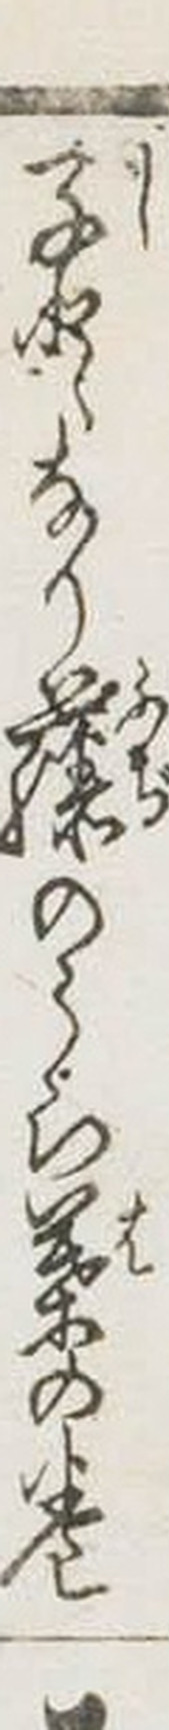子となり藤のうら葉の巻
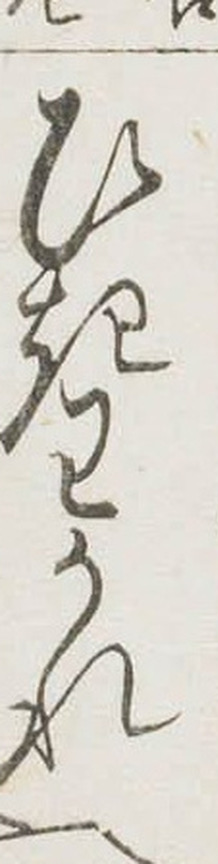ひきわかれ
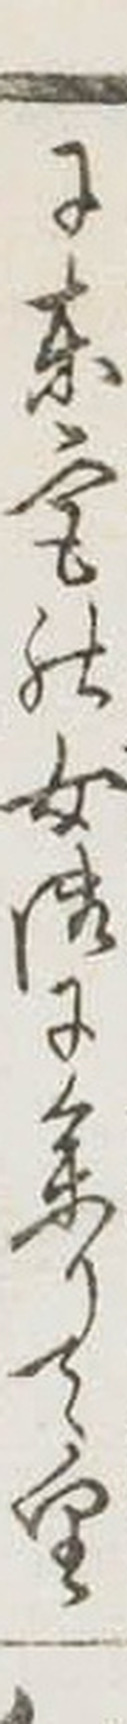に東宮の女御に参りて皇
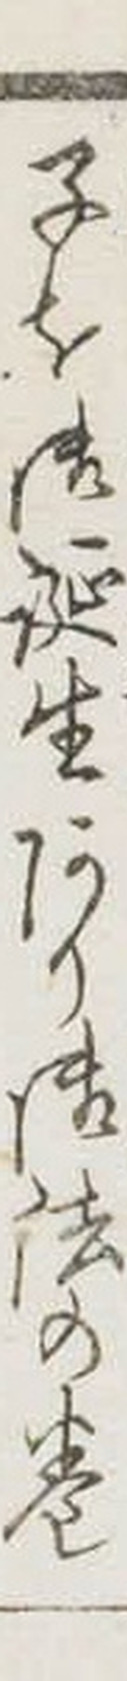子を御誕生あり御法の巻
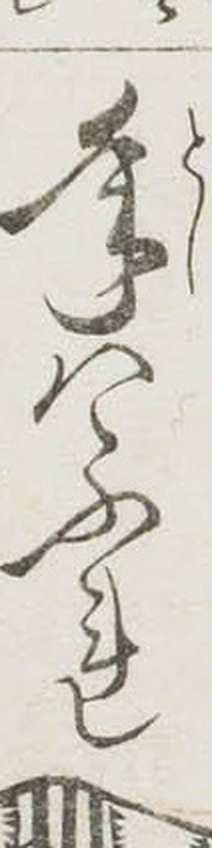年はふれ
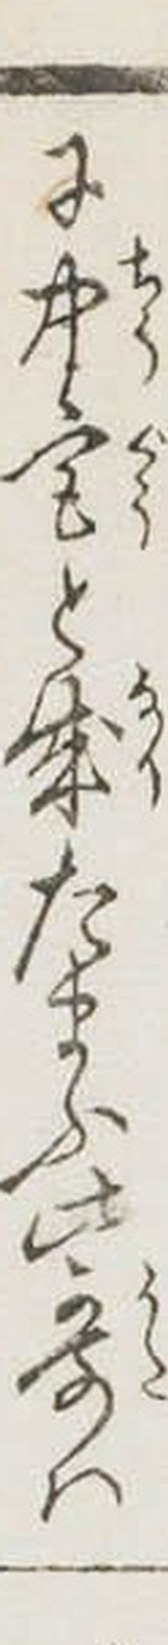に中宮と成たまふ此哥は
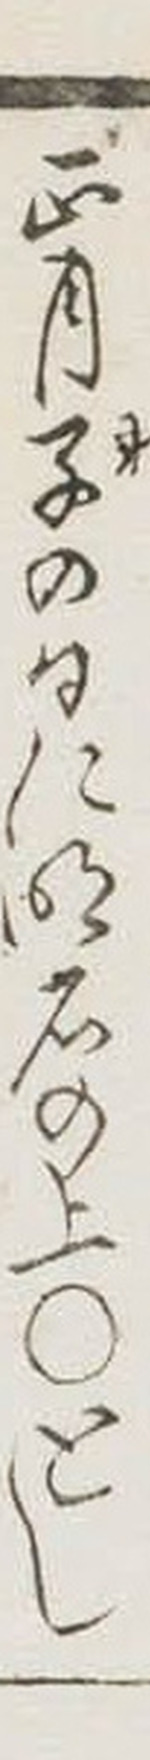正月子の日に明石の上○とし
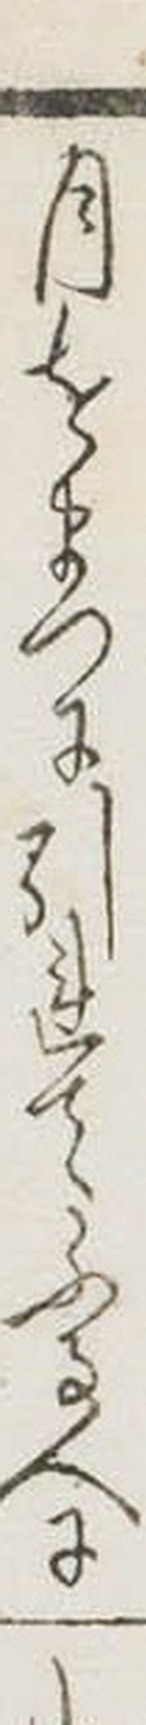月をまつに引れてふる人に
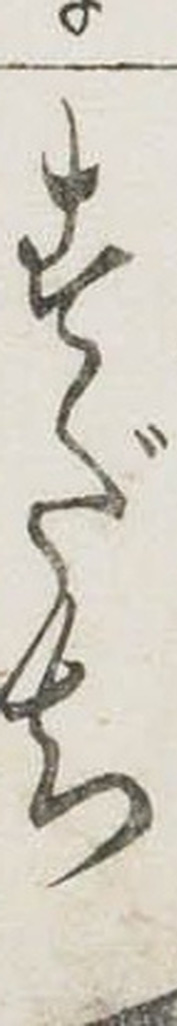すだち
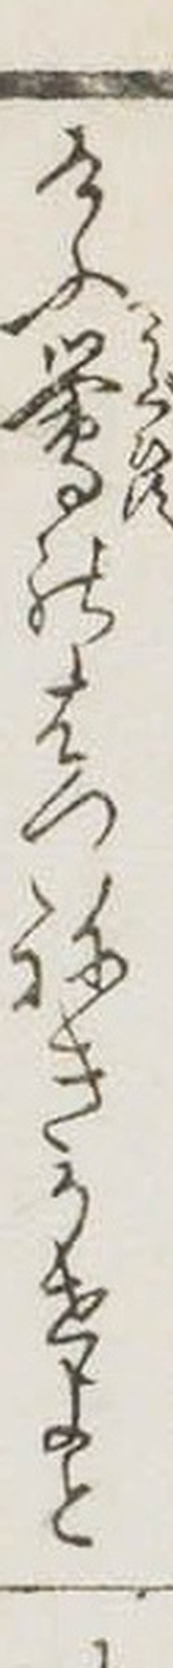けふ鴬のはつねきかせよと
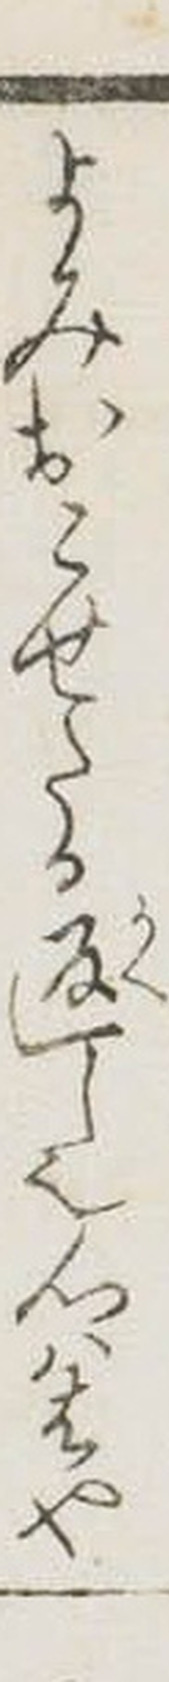よみおこせたる返し也心ははや
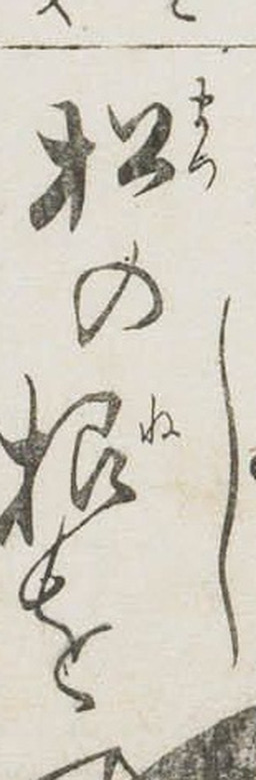松の根を
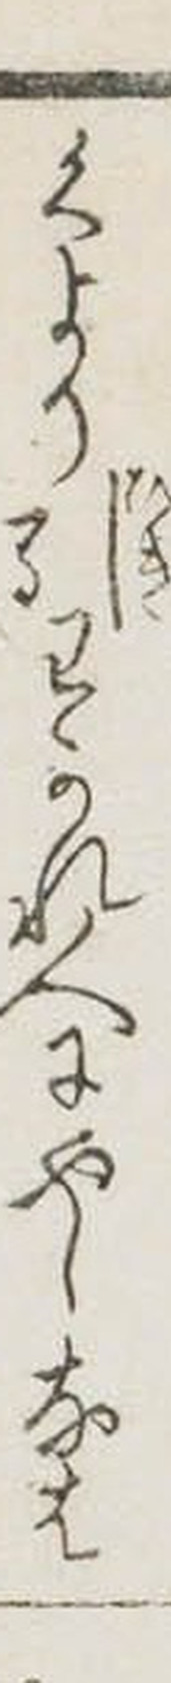くより引わかれ人にやしなは
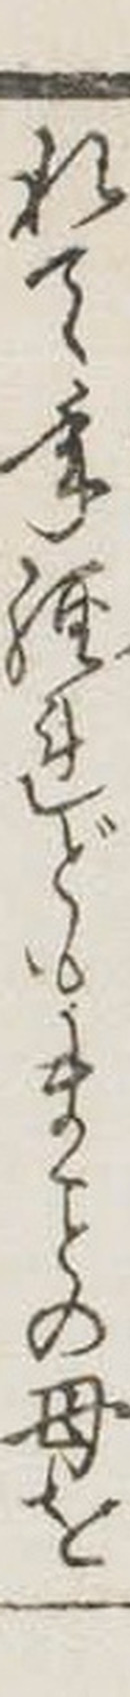れて年経れどもまことの母を
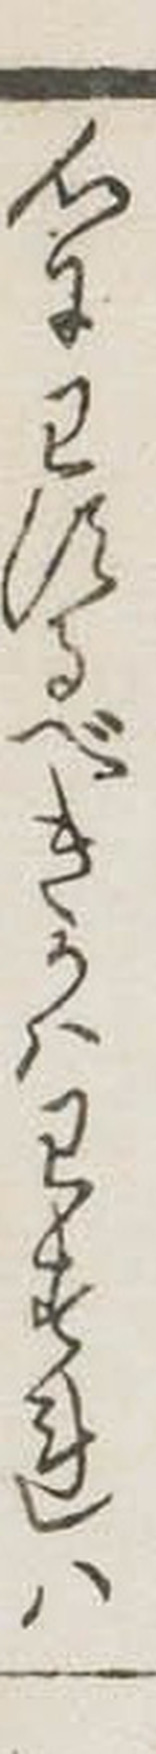心にわするべきかはわすれは
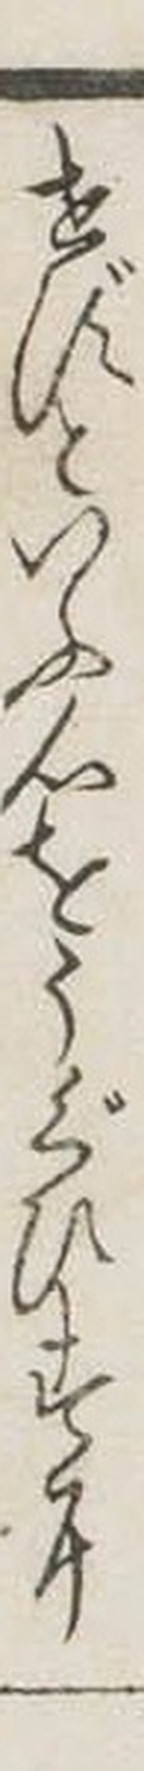せずといふ心をうぐひすに
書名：源氏百人一首
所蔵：東京学芸大学教育コンテンツアーカイブ
